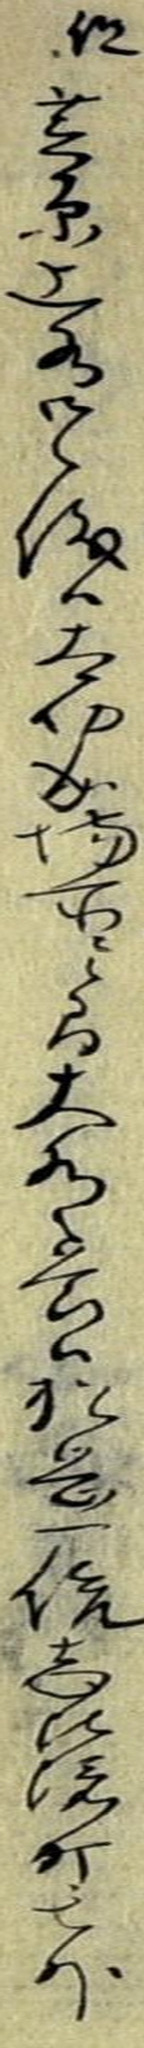但芝原上水口之儀ハ太切成場所ニ候間大水之節ハ松岡一統志比境町其外
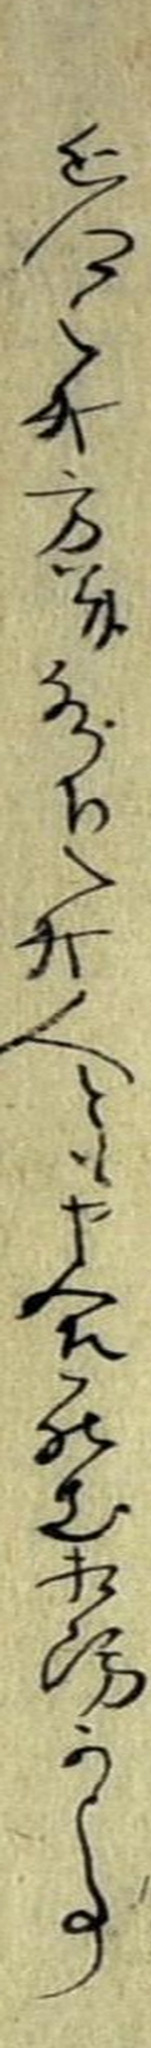近郷之村方并水下之村人とも申合罷出相防可申事
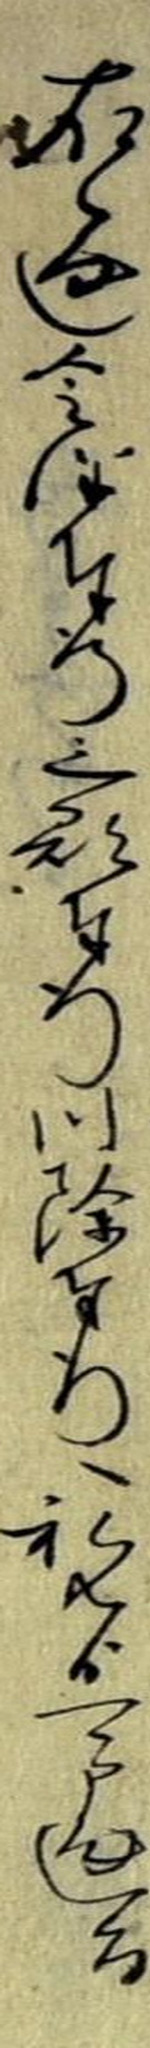右之通金津奉行三郡奉行川除奉行へ私共ゟ可申通旨

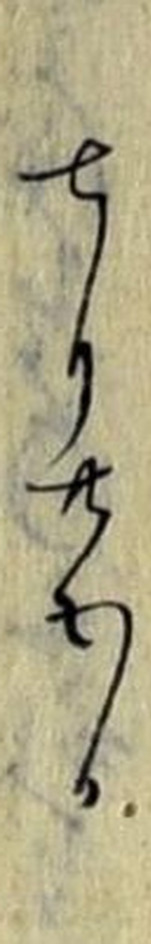七月廿五日
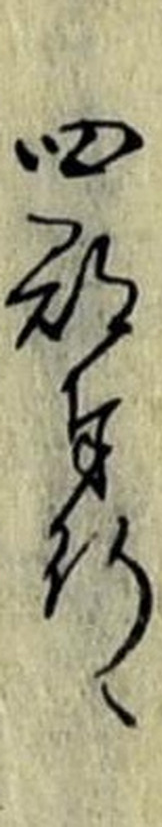四郡奉行へ
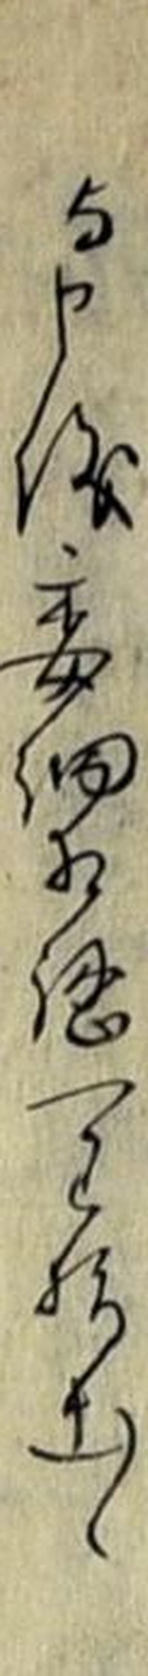与申儀委細相認可被指出候
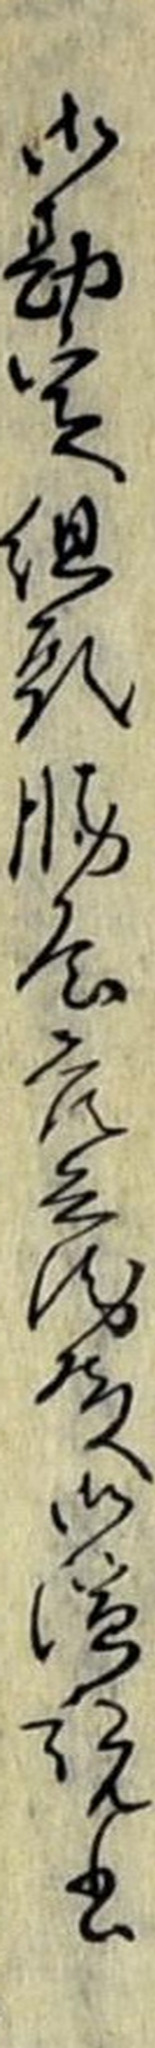御勘定組頭勝屋兵衛殿御演説書
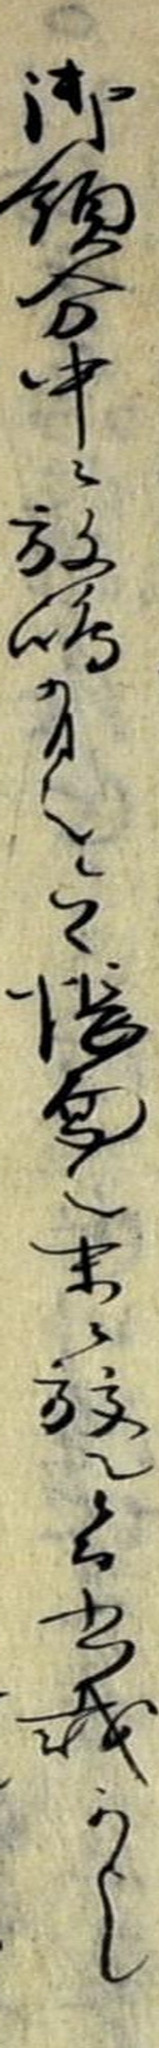御領分中ニ放嶋有之候ハヽ帳面之末ニ放シ候而書載可申候
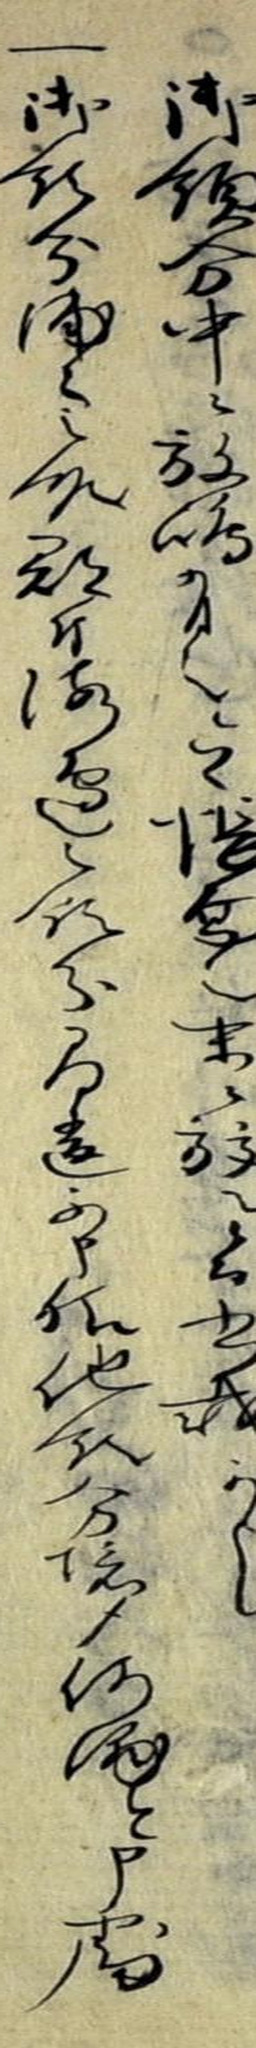一御領分浦々之郡付海辺之領分間違不申様他領分境メ何浦と申処
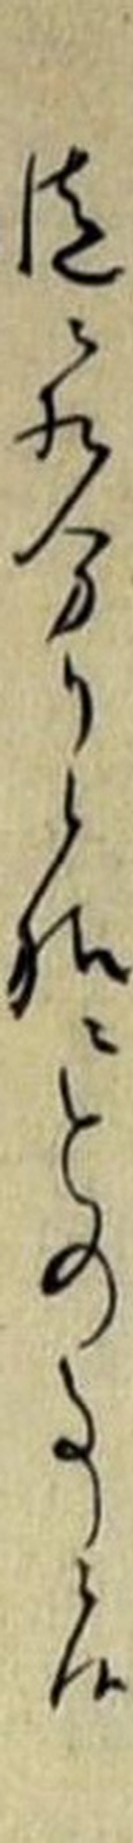慥ニ相分り候様ニとの事ニ候
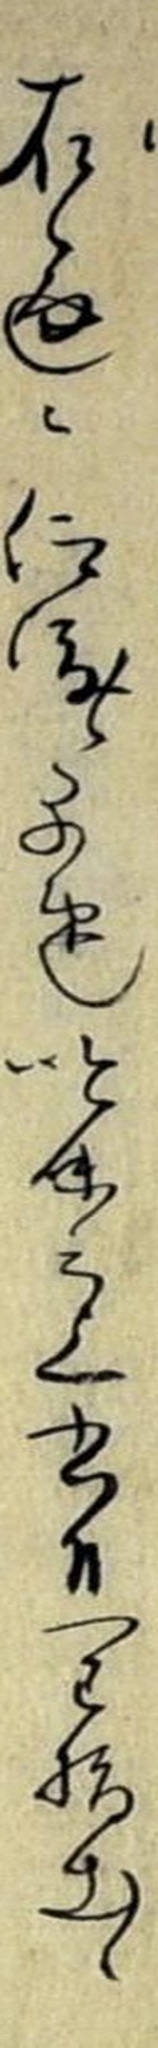右之通被仰渡候早速吟味之上書付可被指出候
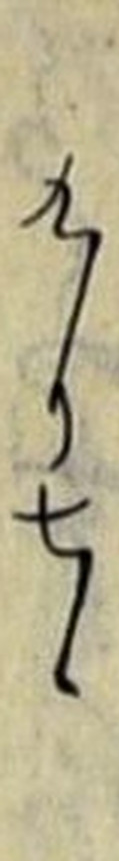九月七日
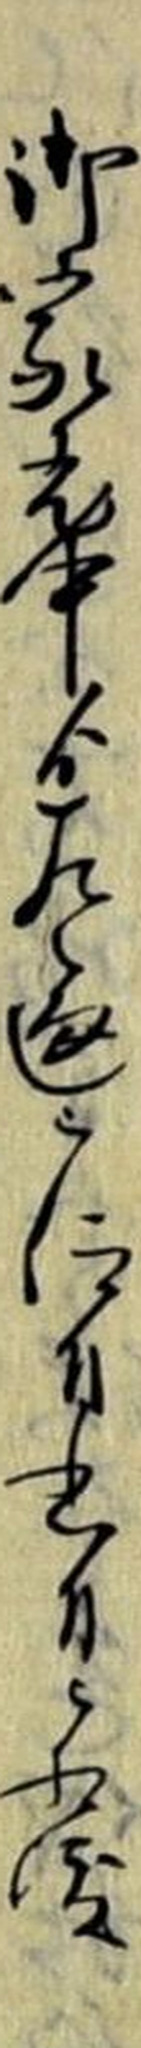御家老中ゟ左之通被仰付書付被相渡
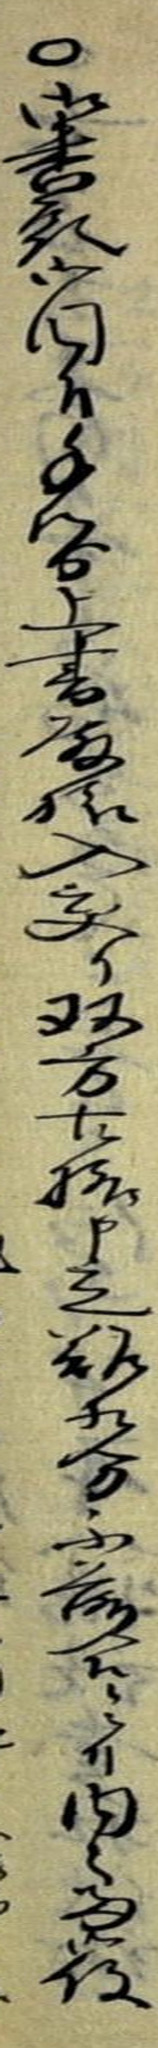〇御番頭御目付手紙上書殿様入交り双方古格申立難相分不落合候ニ付内々両御役
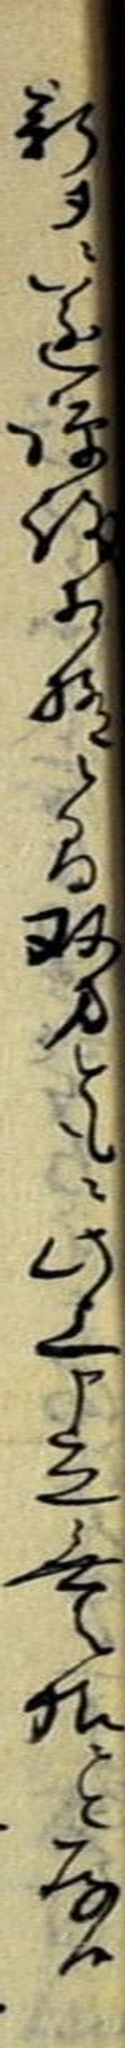新タニ遂評議相極候間双方ともニ此上申立無之様ニと存候
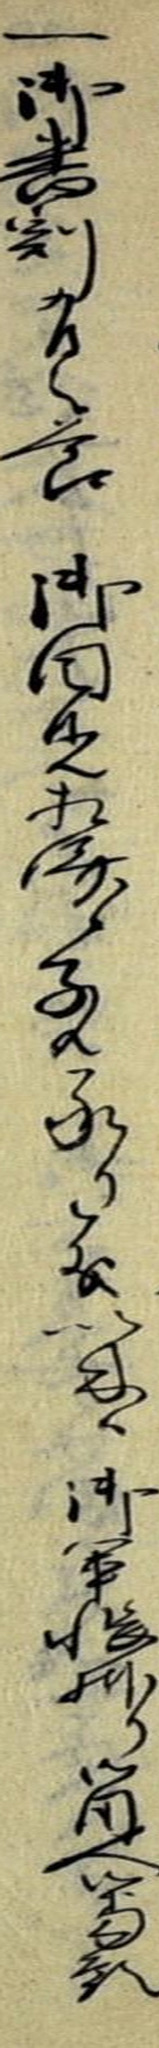一御番割有之節御目見相済候子共承り候義以来ハ御軍帳掛り御用人御番頭
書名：命令之部 三
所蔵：福井県文書館 Fukui Prefectural Archives
